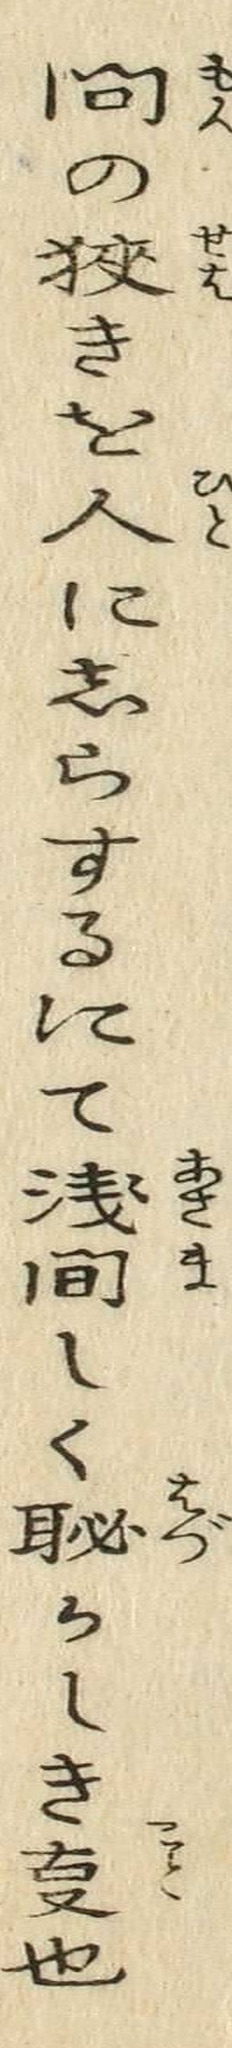問の狭きを人にしらするにて浅間しく恥かしき㕝也
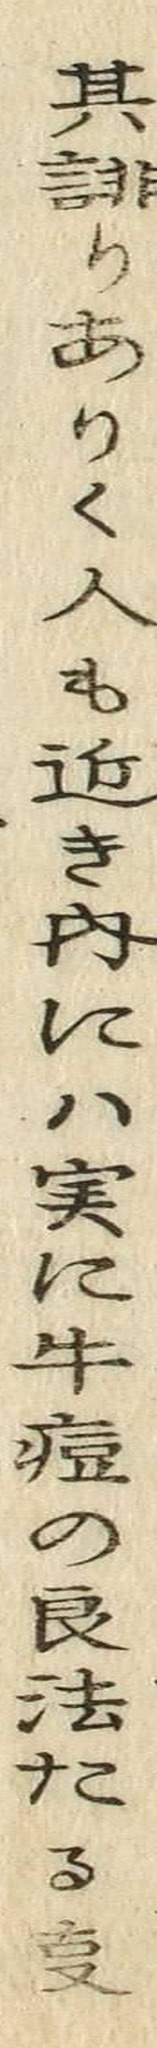其誹りありて人も近き内にハ実に牛痘の良法たる㕝
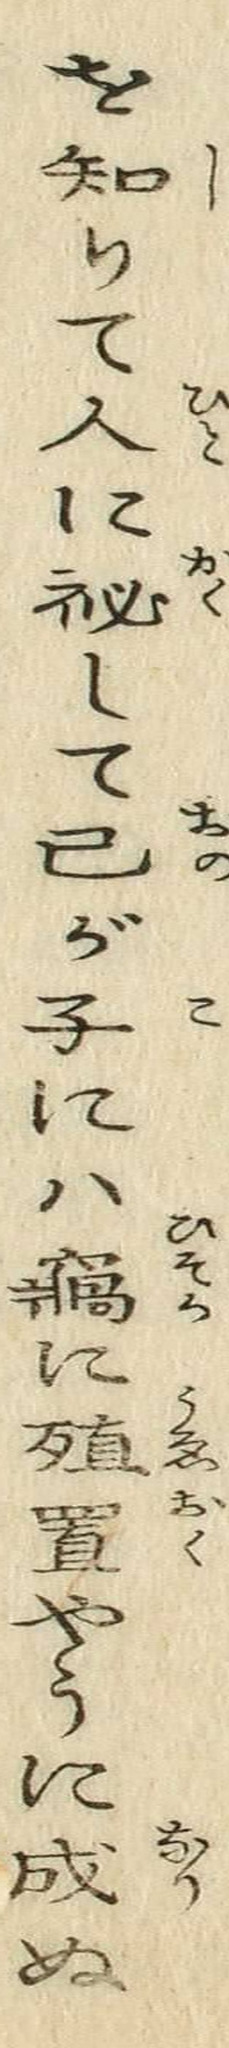を知りて人に秘して己が子にハ竊に殖置やうに成ぬ
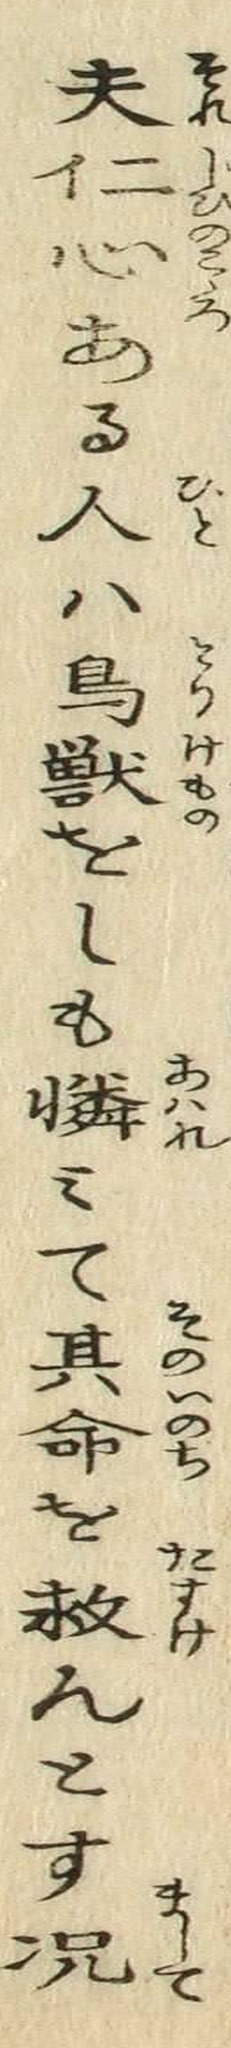夫仁心ある人ハ鳥獣をしも憐みて其命を救んとす況

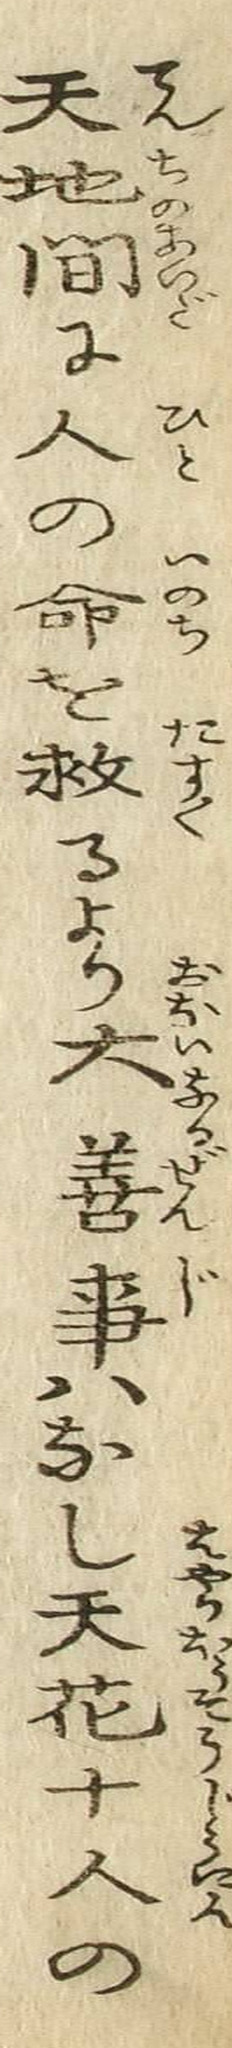天地間に人の命を救るより大善事ハなし天花十人の
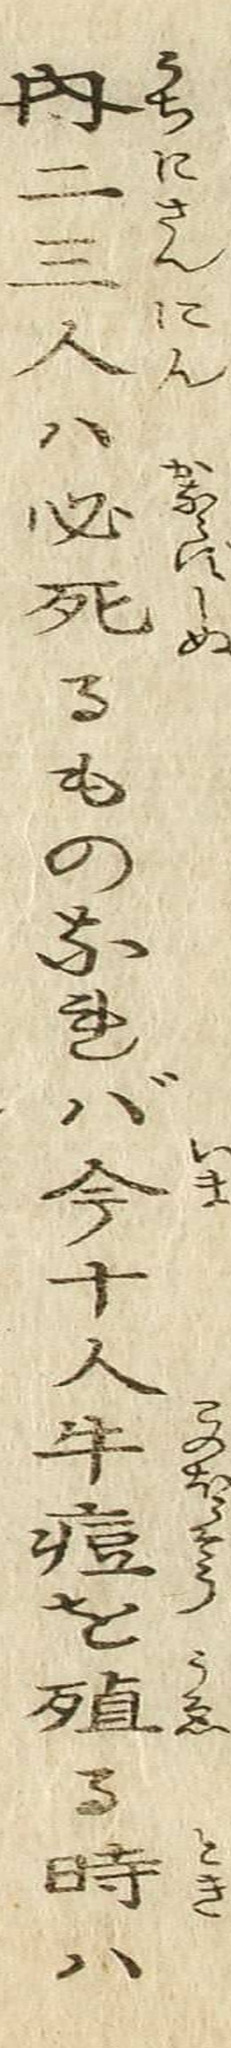内二三人は必死るものなれバ今十人牛痘を殖る時ハ
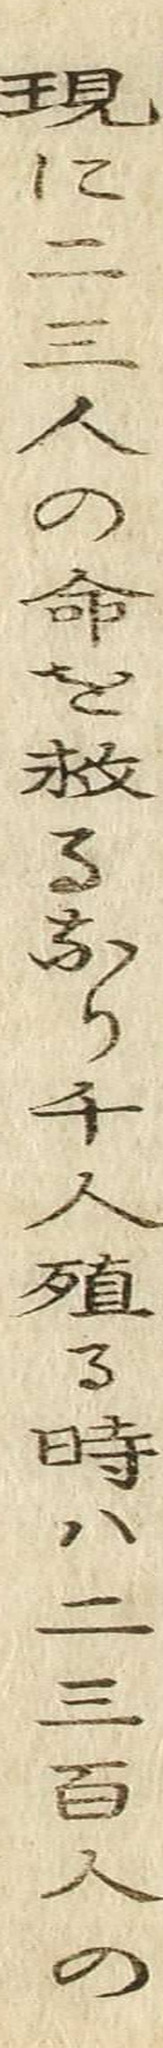現に二三人の命を救るなり千人殖る時ハ二三百人の
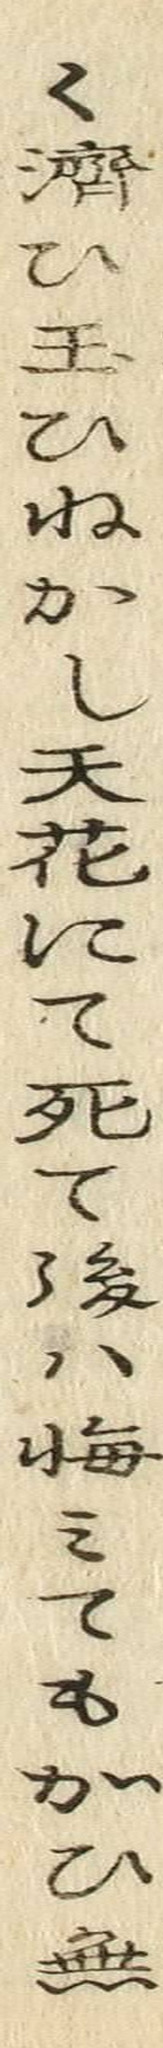く濟ひ玉ひねかし天花にて死て後ハ悔みてもかひ無
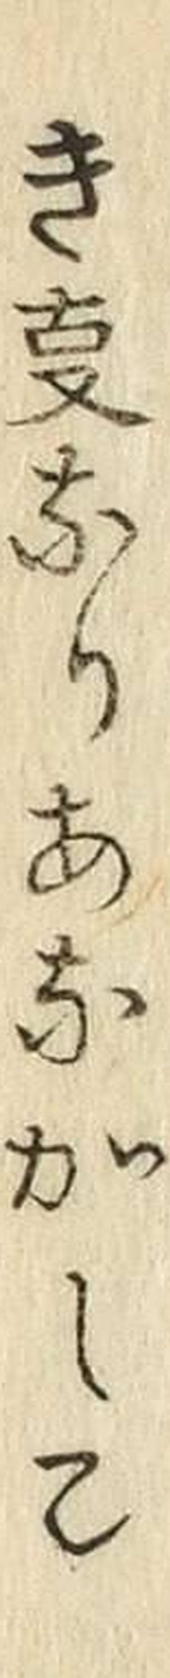き㕝なりあながして
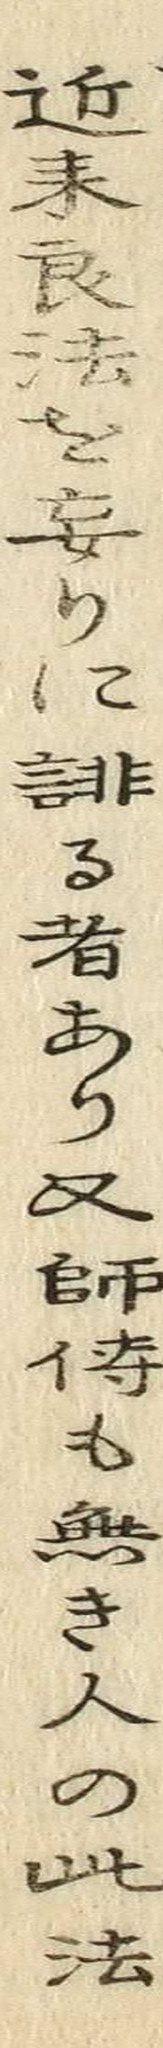近来良法を妄りに誹る者あり又師傅も無き人の此法
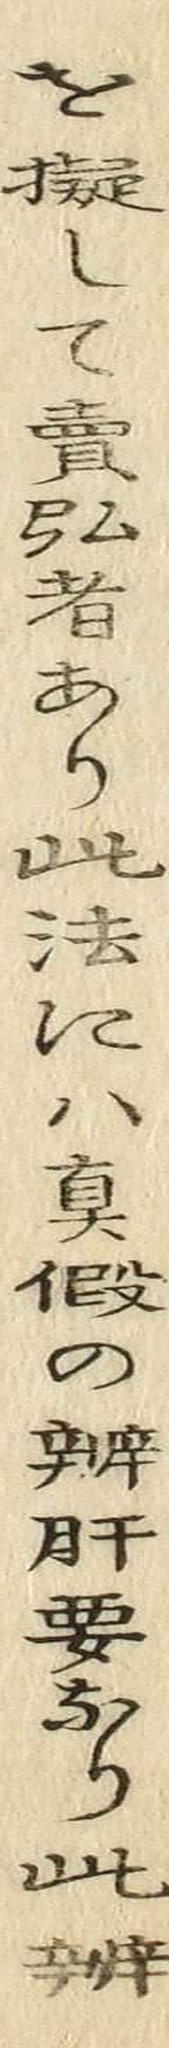を擬して賣弘者あり此法にハ真假の辨肝要なり此辨
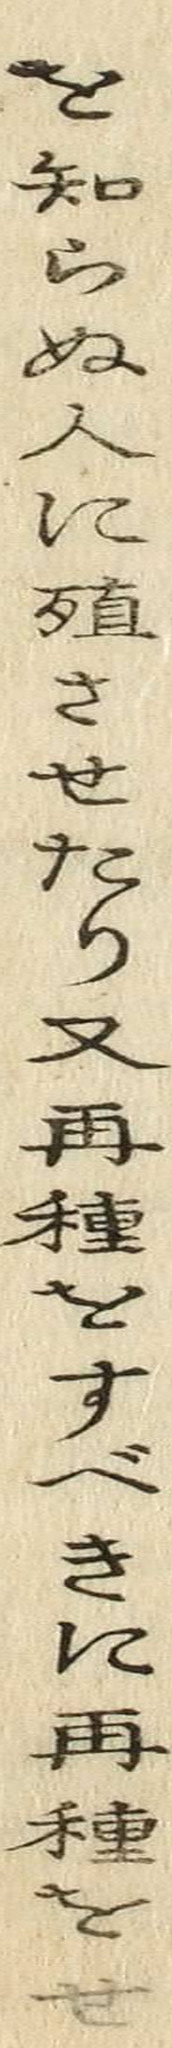を知らぬ人に殖させたり又再種をすべきに再種をせ
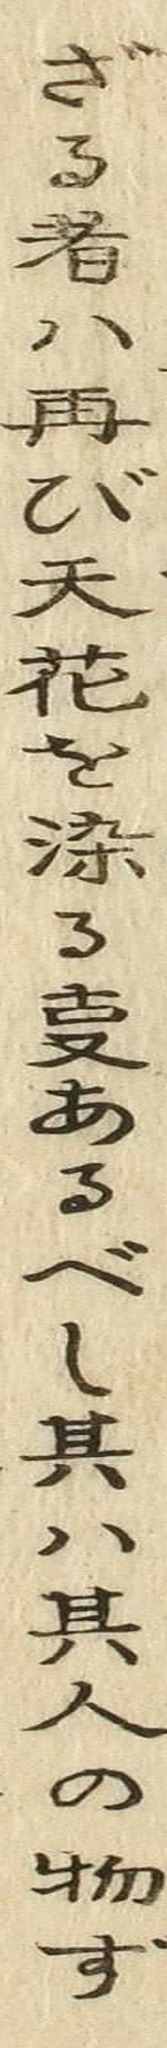ざる者ハ再び天花を染る㕝あるべし其ハ其人の物ず
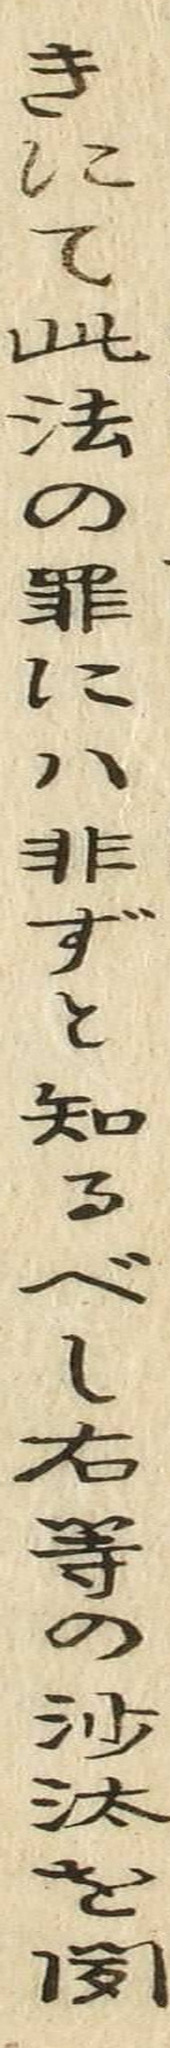きにて此法の罪にハ非ずずと知るべし右等の沙汰を聞
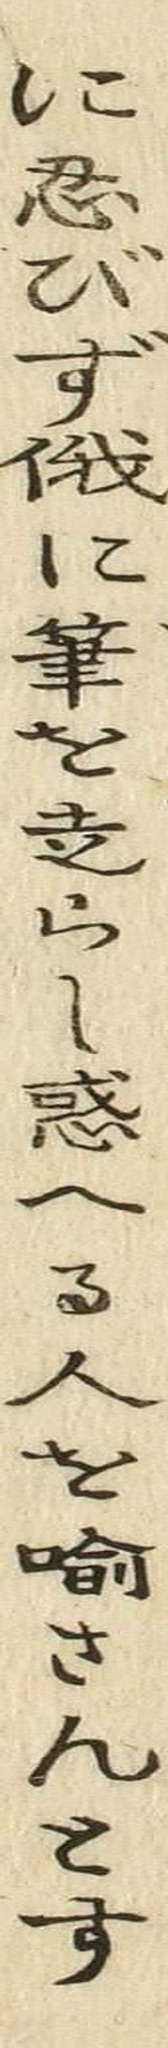に忍びず俄に筆を走らし惑へる人を喩さんとす
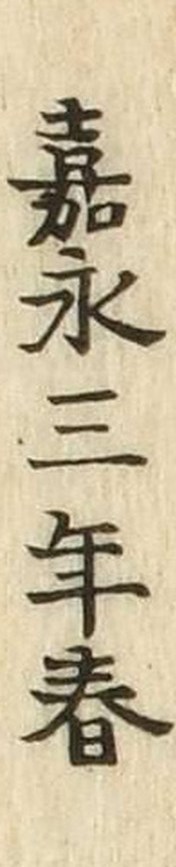嘉永三年春
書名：牛痘問答
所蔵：九州大学医学図書館 国文学研究資料館
